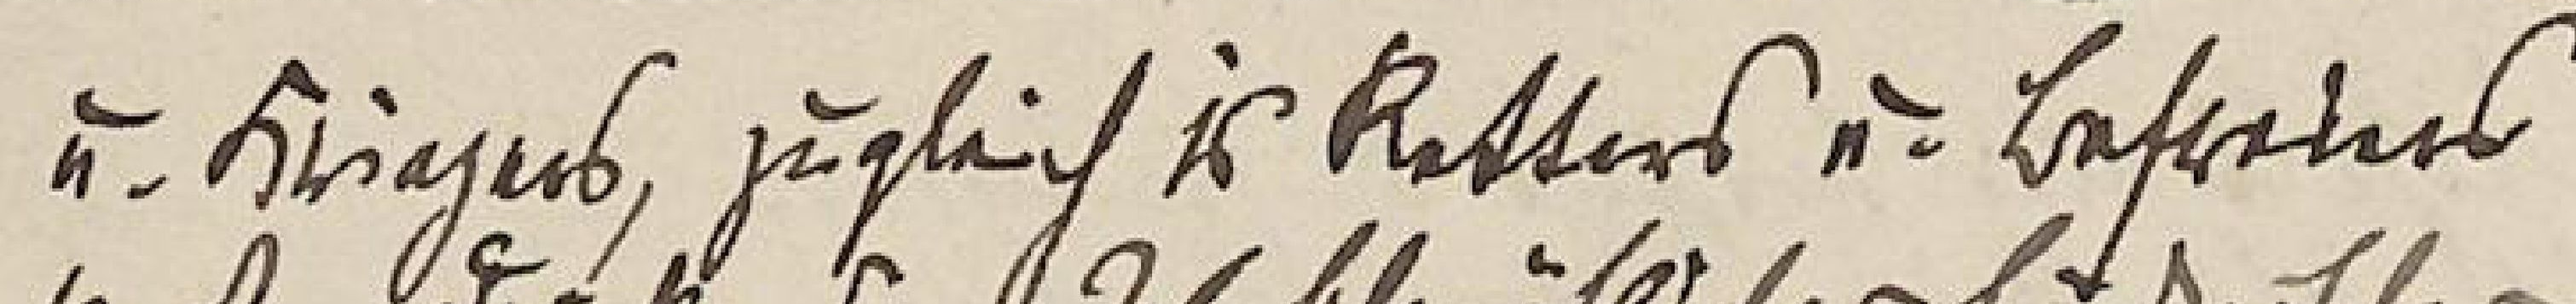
u. Kriegers, zugleich 1s Retters u. Befreiers
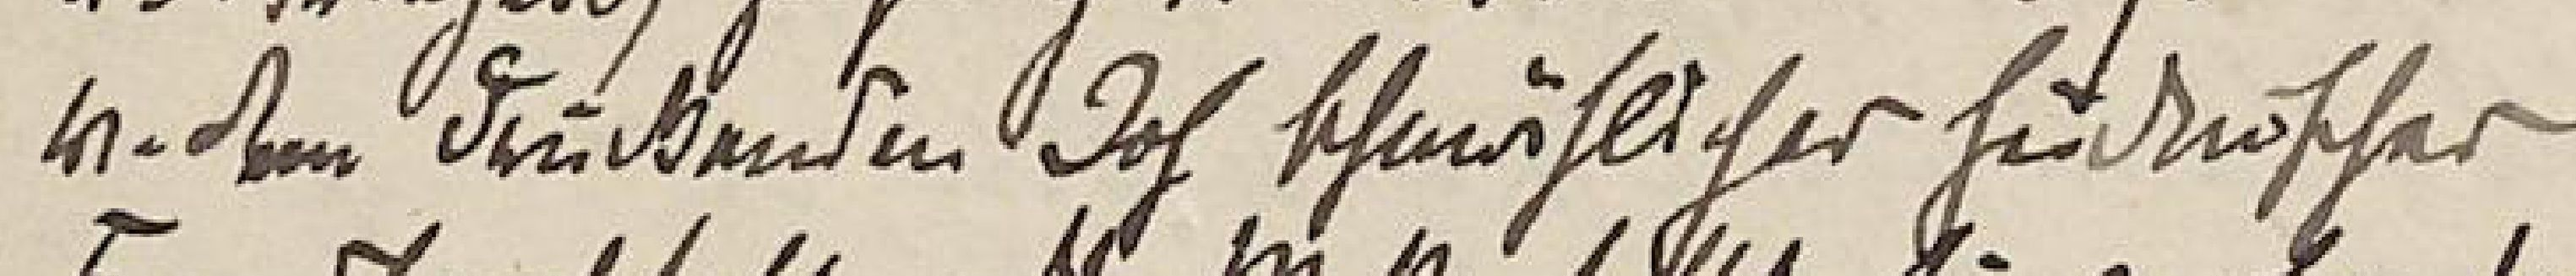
v. dem drückenden Joch schwächlicher heidnischer
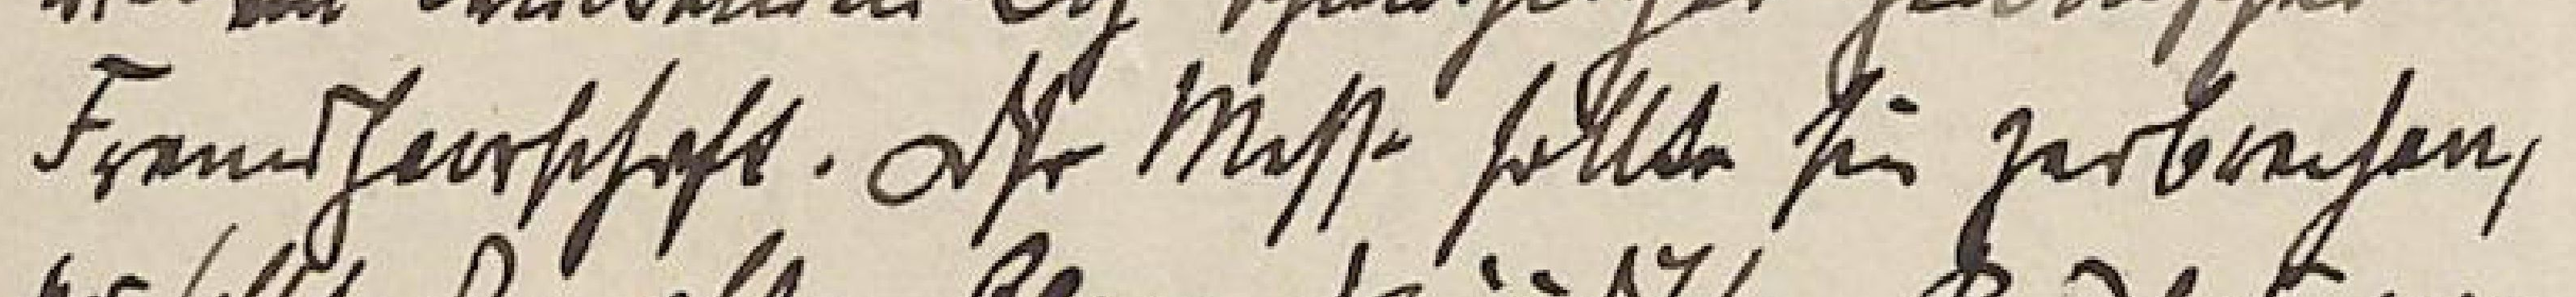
Fremdherrschaft. Dsr Mess. sollte sie zerbrechen,
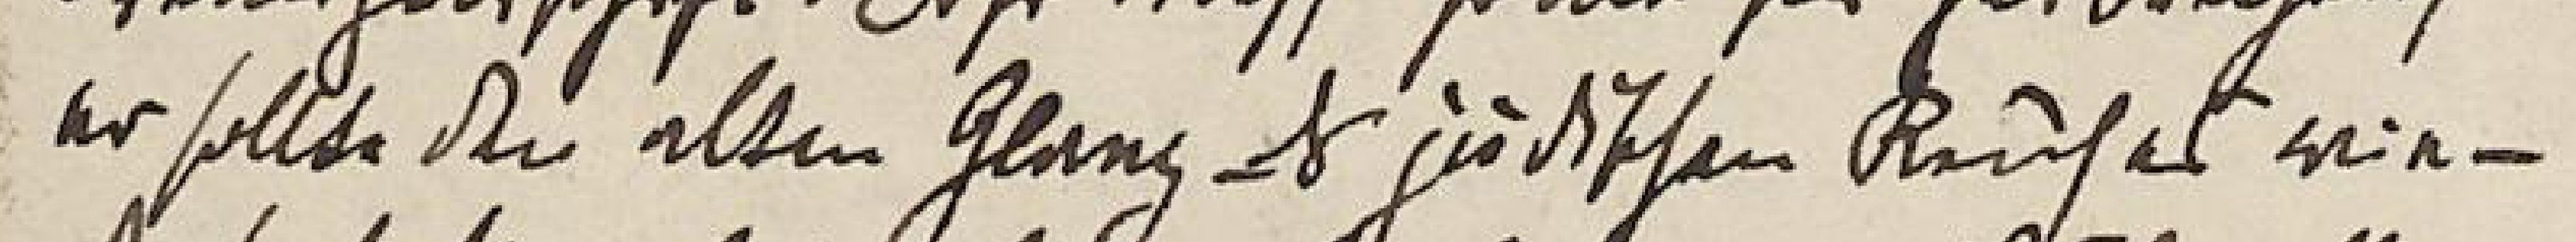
er sollte den alten Glanz ds. jüdischen Reiches wieder¬
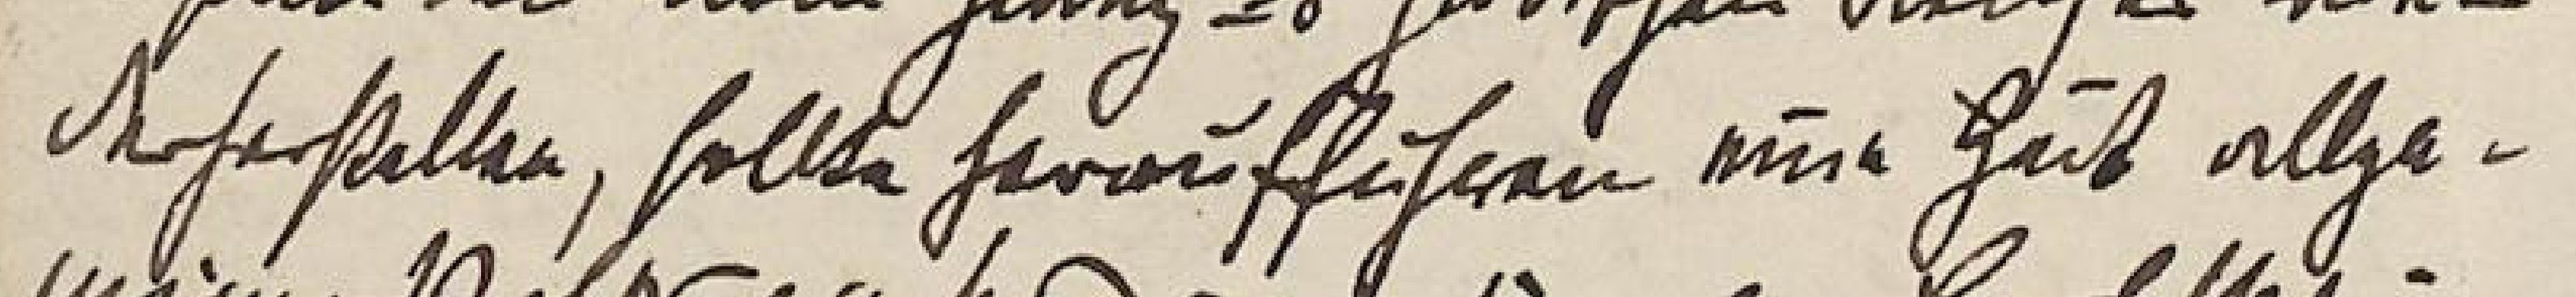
herstellen, sollte heraufführen eine Zeit allge¬
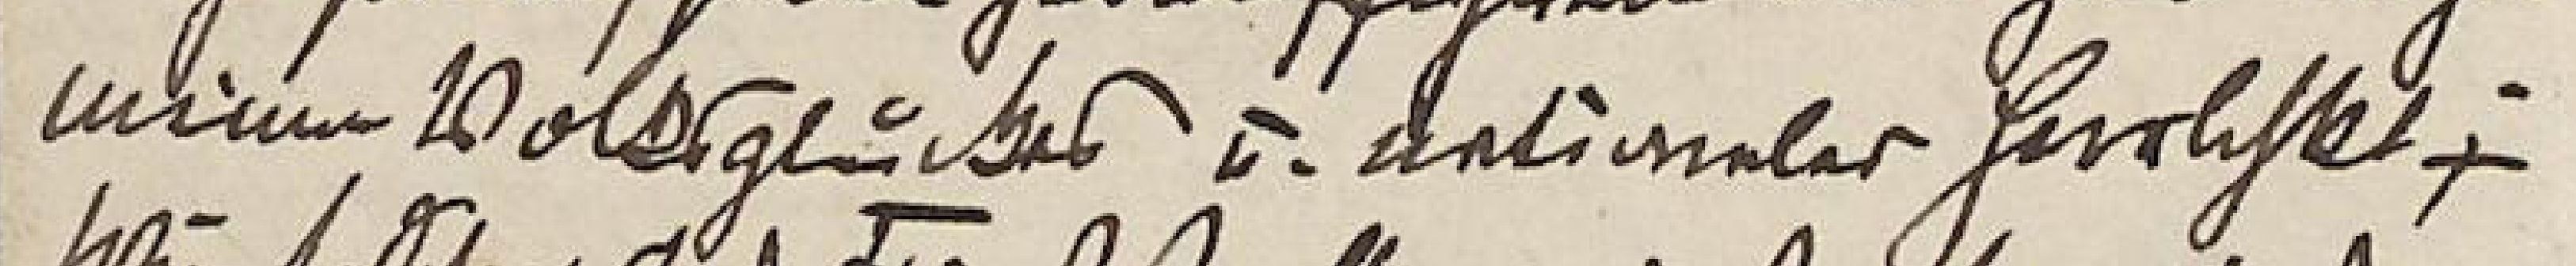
meinen Volksglückes u. nationaler Herrlichkt,
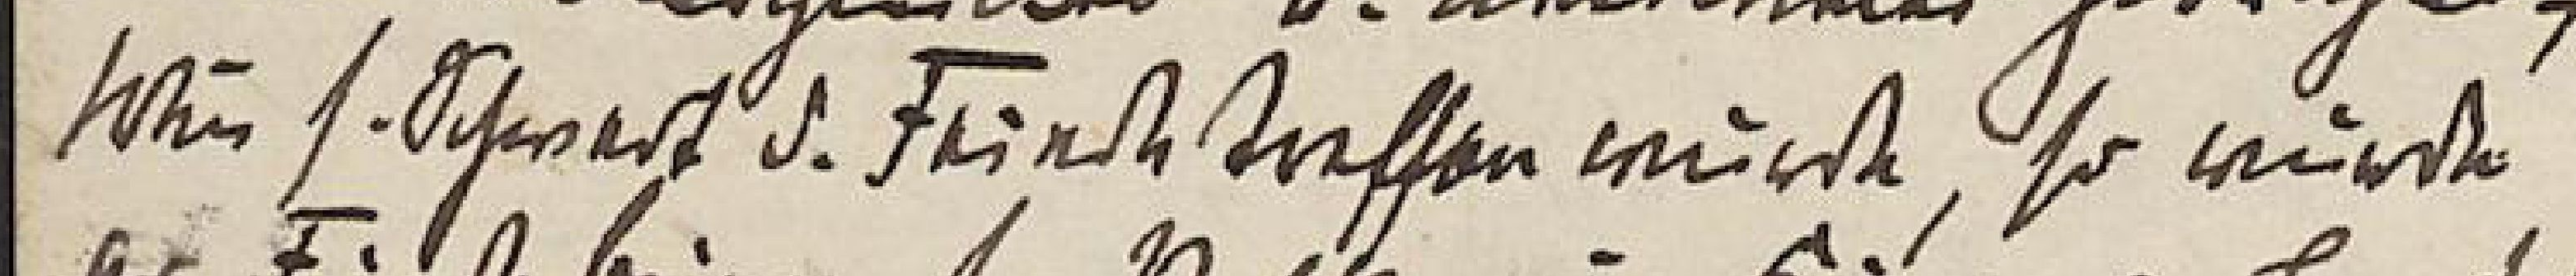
Wie s. Schwert d. Friede treffen würde, so würde
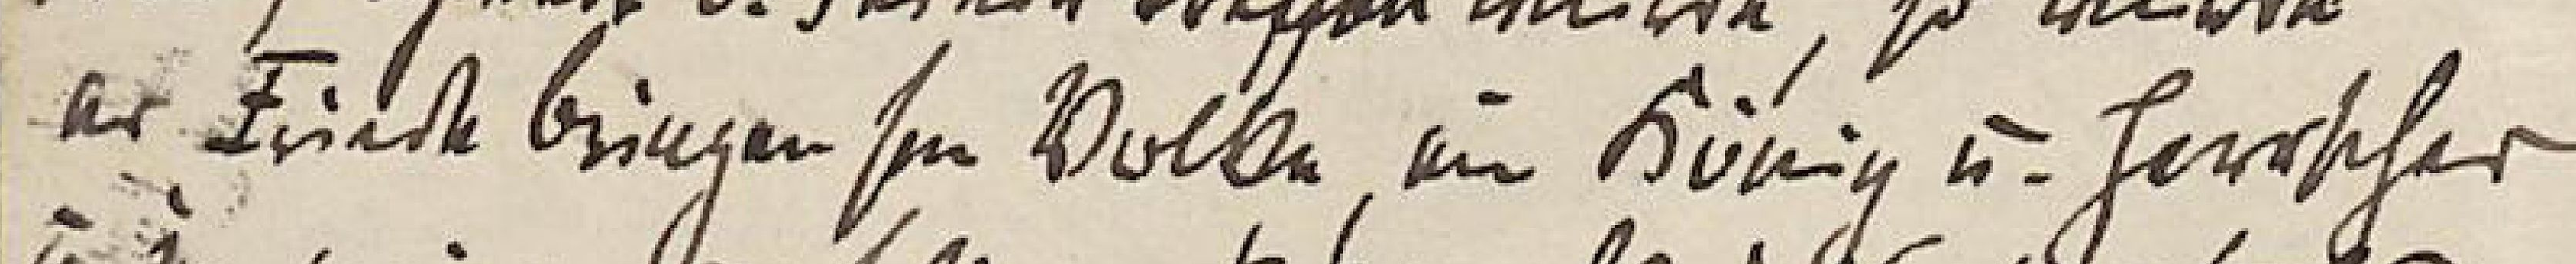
er Friede bringen sm Volke, ein König u. Herrscher
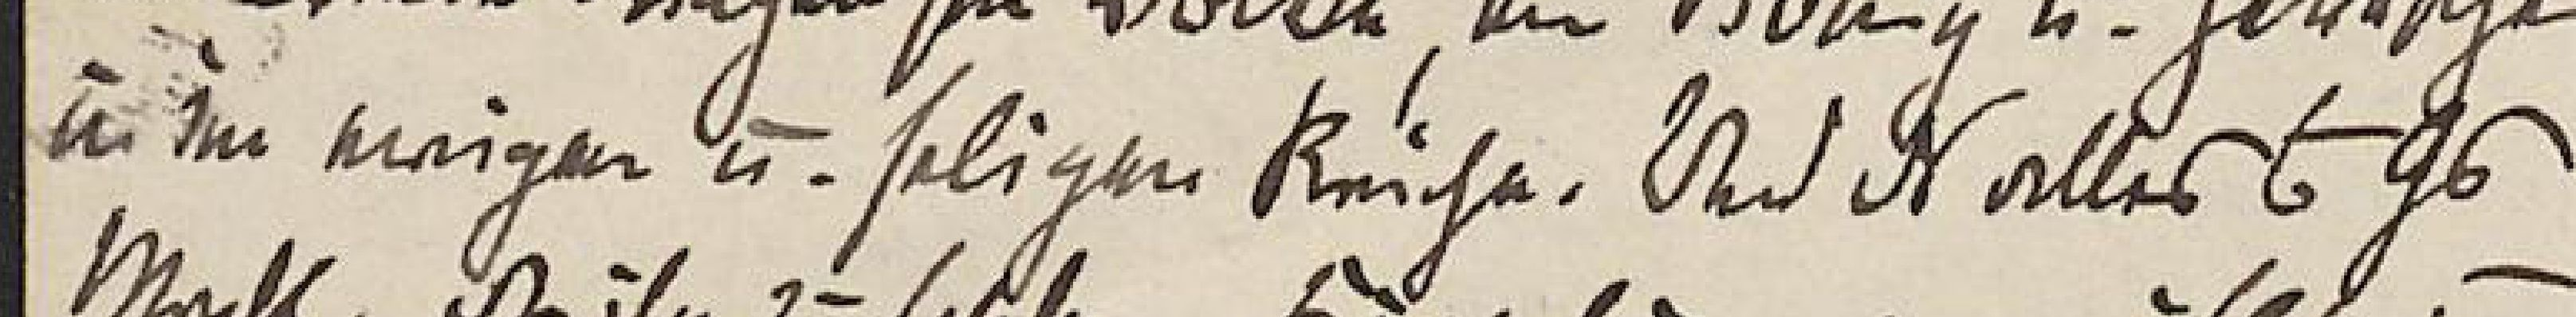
in 1m ewigen u. seligen Reiche. Und das alls s Gs
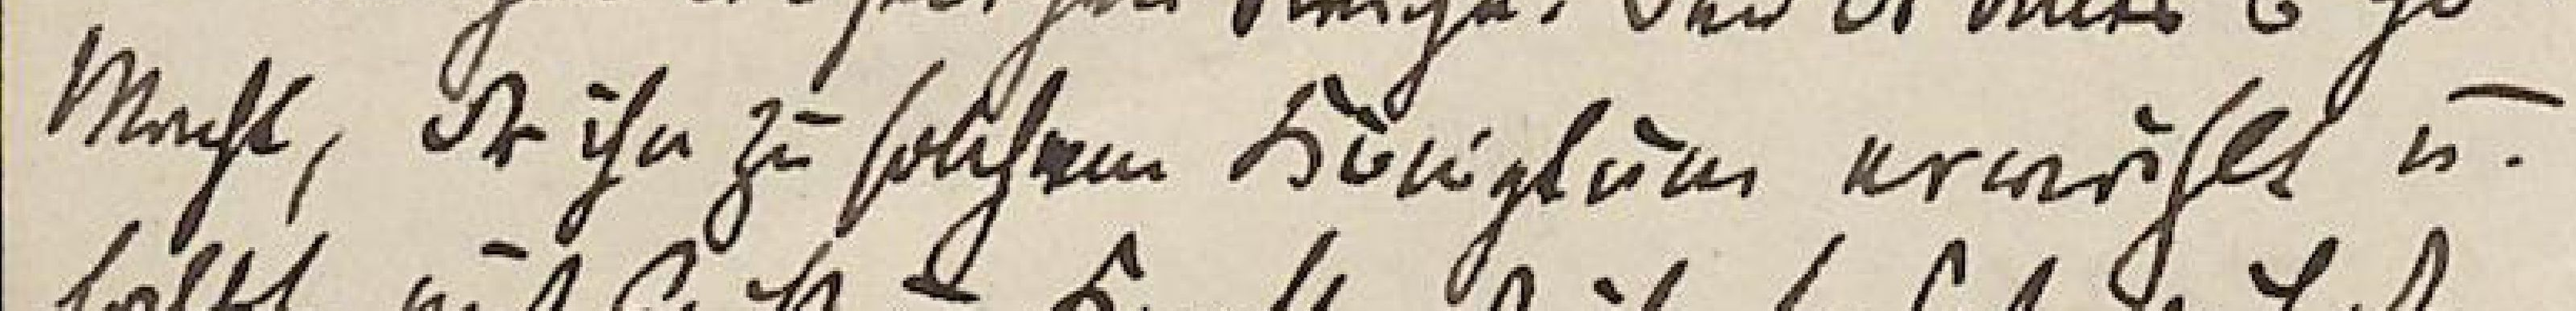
Macht, dr ihn zu solchem Königtum erwählt u.
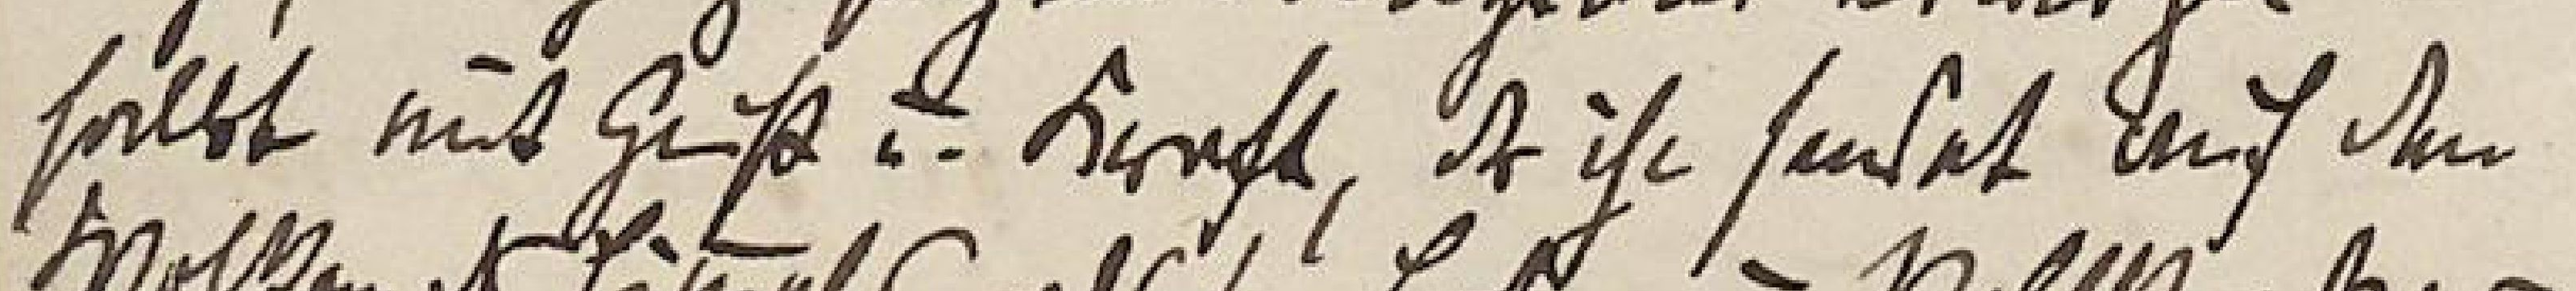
solbst mit Geist u. Kraft, dr ihn sendet auf den
